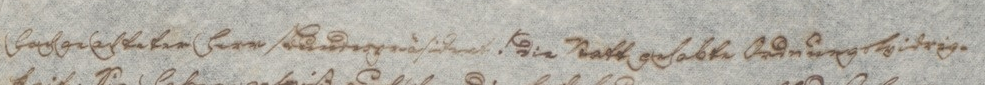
Hochgeachteter Herr Bundespräsident! die Statt gehabte Ordnungswidrig-
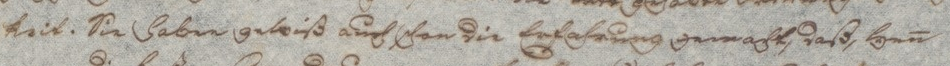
keit. Sie haben gewiß auch schon die Erfahrung gemacht, daß, wenn
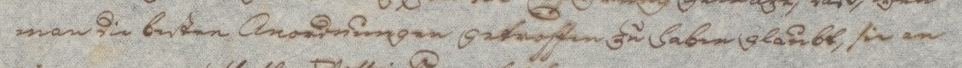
man die besten Anordnungen getroffen zu haben glaubt, sie an
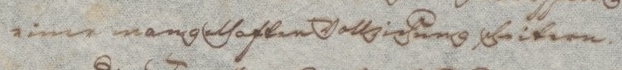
einer mangelhaften Vollziehung scheitern.
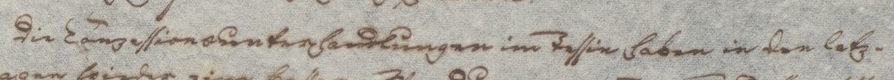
Die Conzessionsunterhandlungen im Tessin haben in den letz-
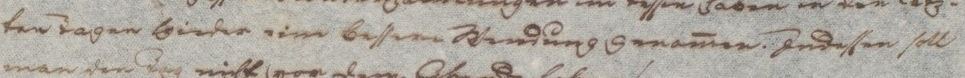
ten Tagen wieder eine bessere Wendung genommen. Indessen soll
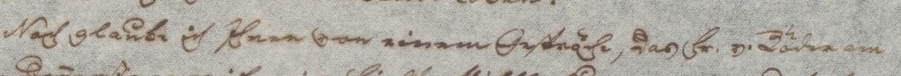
Noch glaube ich Ihnen von einem Gespräche, das Hr. v. Röder am
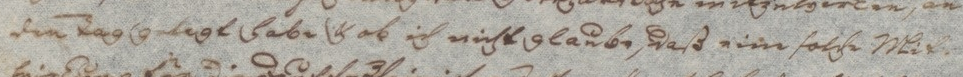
den Tag gelegt habe & ob ich nicht glaube, daß eine solche Mit-
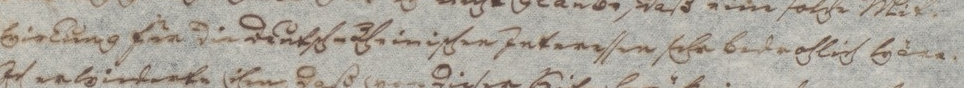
wirkung für die Deutsch-Rheinischen Interessen sehr bedrohlich wäre.
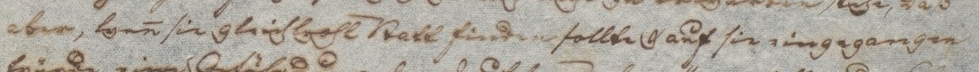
aber, wenn sie gleichwohl Statt finden sollte & auf sie eingegangen
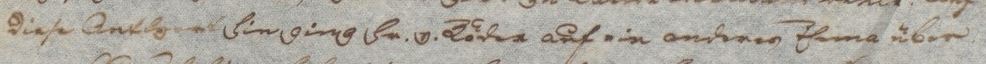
diese Antwort hin ging Hr. v. Röder auf ein anderes Thema über.
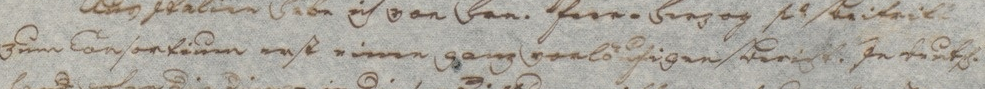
zum Consortium erst einen ganz vorläufigen Bericht. In Deutsch-
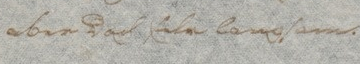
aber doch sehr langsam.
